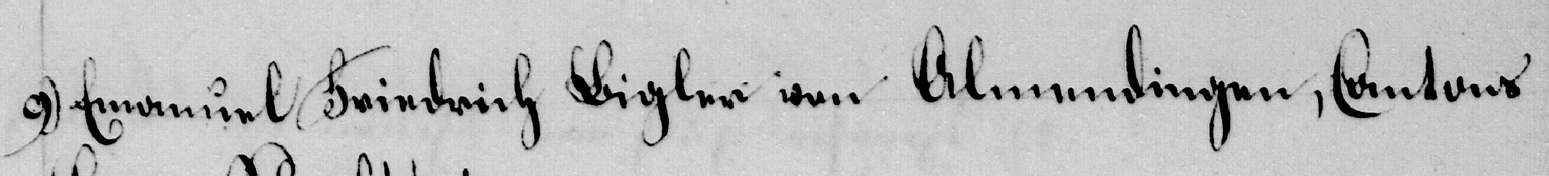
9.) Emanuel Heinrich Bigler von Almendingen, Cantons
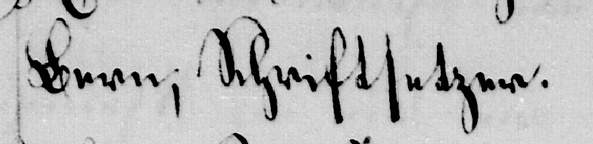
Bern, Schriftsetzer.
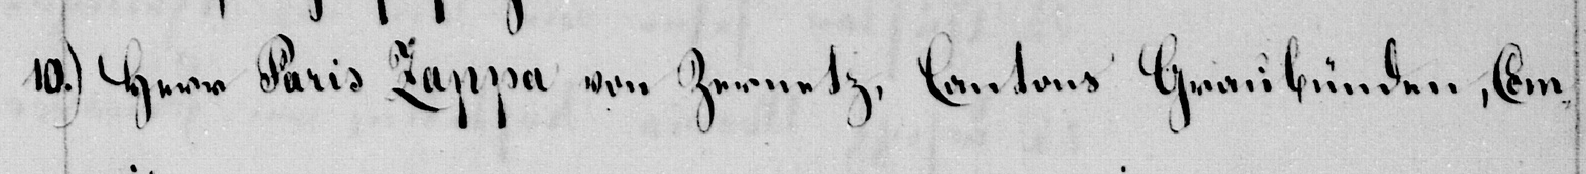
10.) Herr Paris Zappa von Zernetz, Cantons Graubünden, Com¬
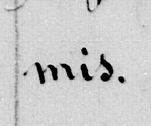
mis.
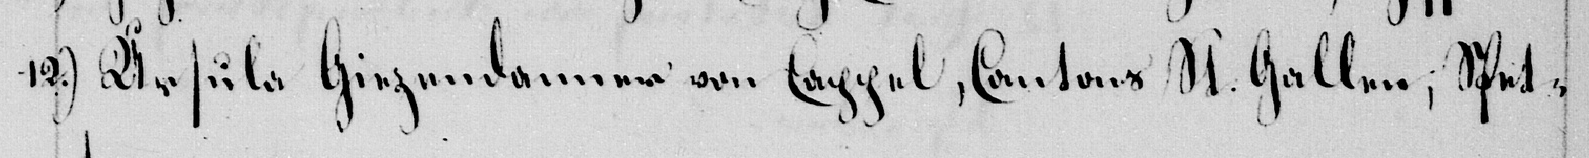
12.) Ursula Giezendanner von Cappel, Cantons St. Gallen, Spet¬
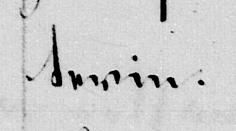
terin.
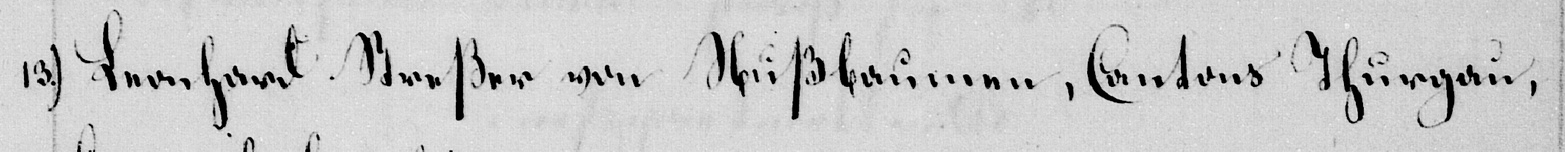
13.) Leonhart Straßer von Nußbaumen, Cantons Thurgau,
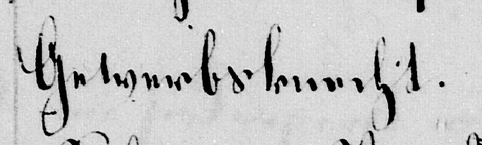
Gewerbsknecht.
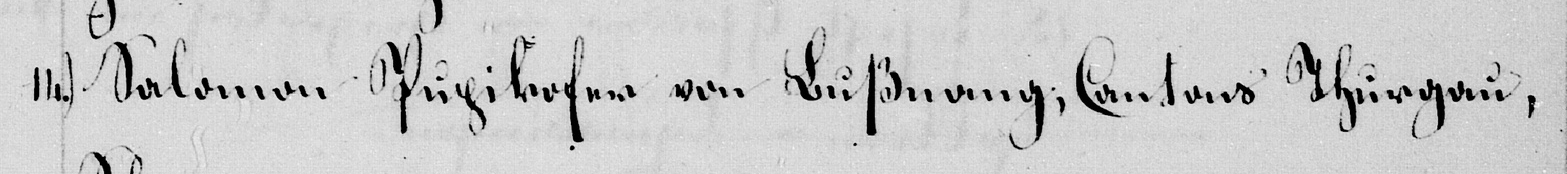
14.) Salomon Pupikofer von Bußnang, Cantons Thurgau,
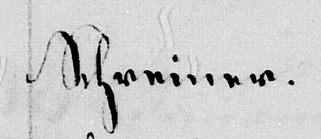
Schreiner.
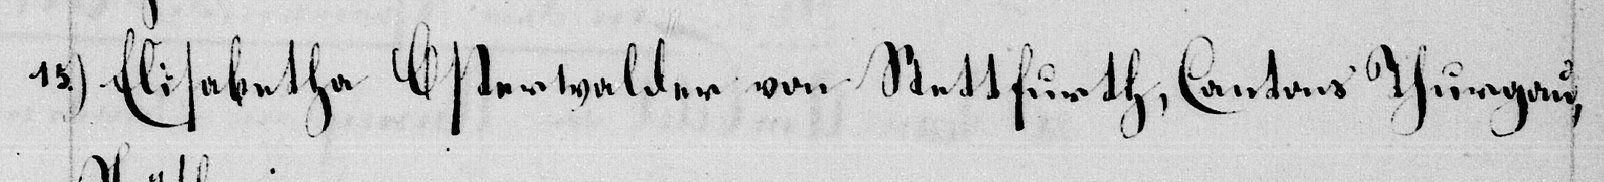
15.) Elisabetha Osterwalder von Stettfurth, Cantons Thurgau,
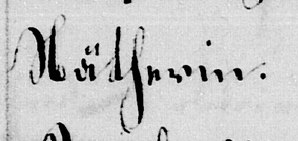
Nätherin.
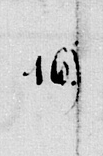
16.)
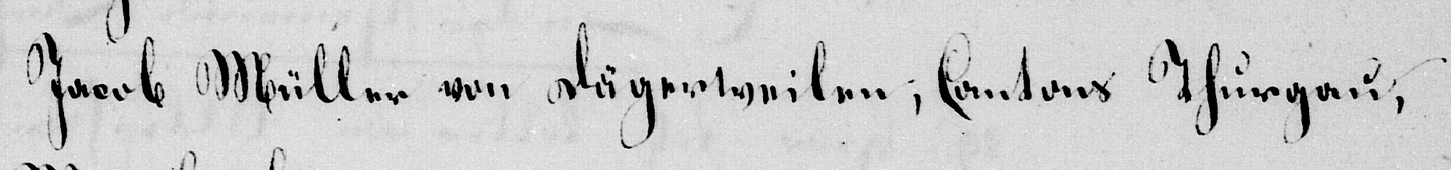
Jacob Müller von Tägerweilen, Cantons Thurgau,
